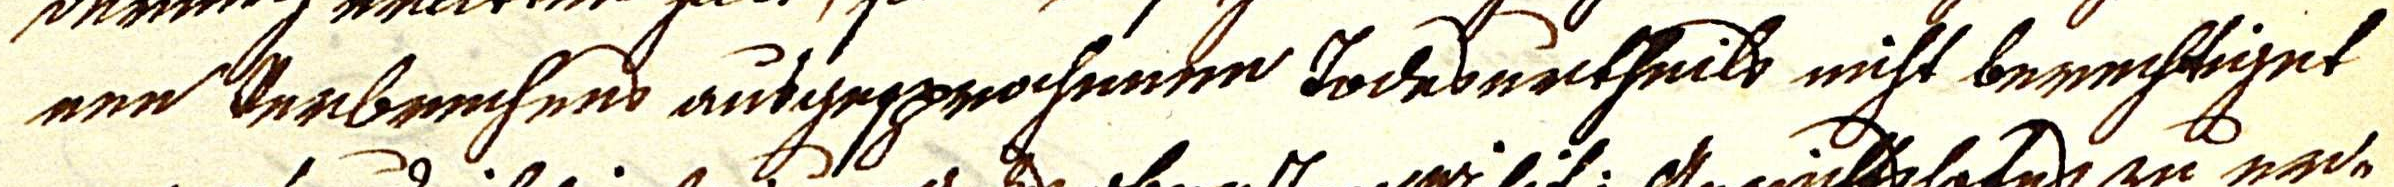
nen Kerbrechens ausgesprochenen Todesurtheils nicht berechtiget
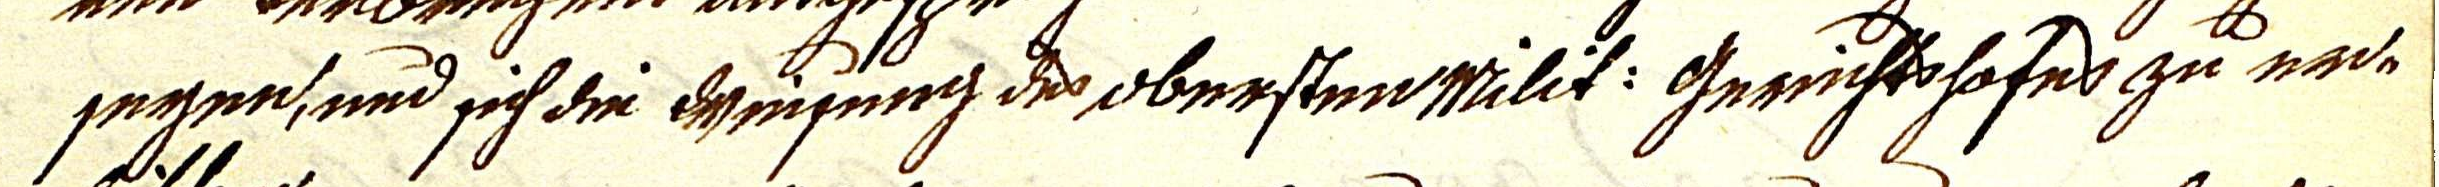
segne, und sich die xxxsung des obersten Milit: Gerichtshofes zu er¬
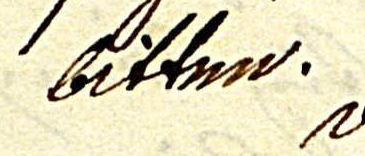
bitten.
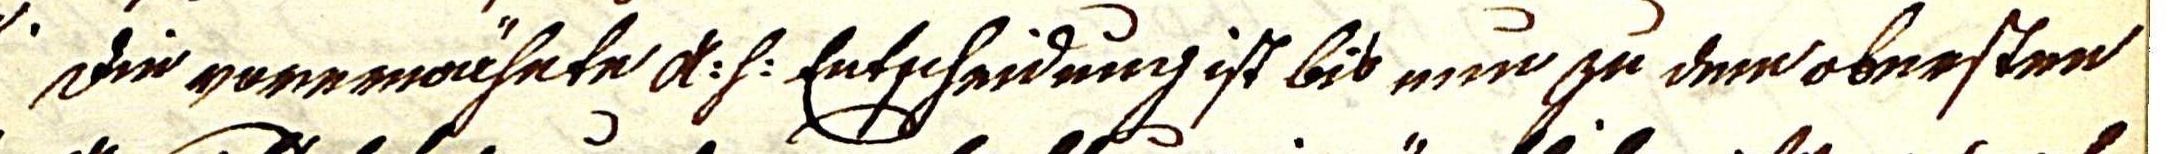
Die vorerwähnte A: h: Entscheidung ist bis nun zu dem obersten
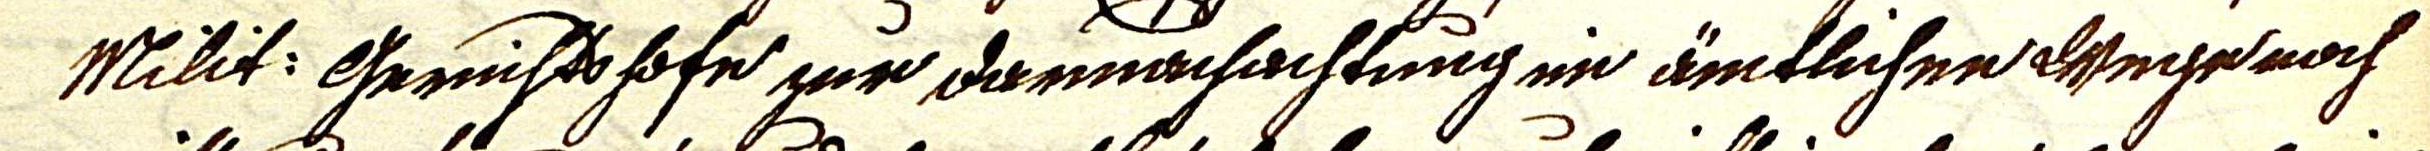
Milit: Gerichtshofe zur Darnachachtung im ämtlichen Wege noch
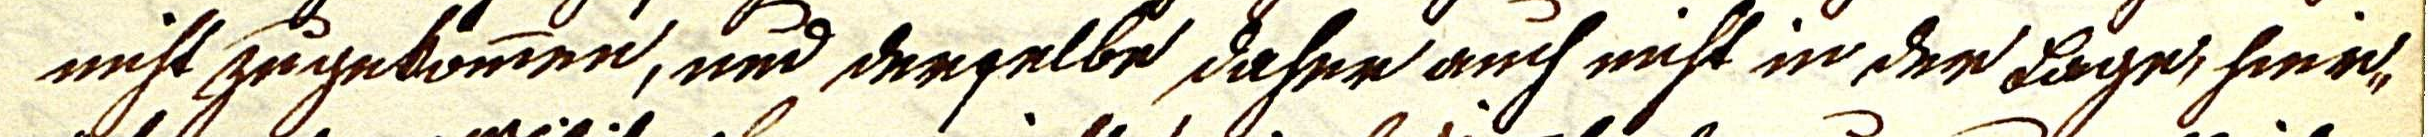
nicht zugekommen, und derselbe daher auch nicht in der Lage, hier¬
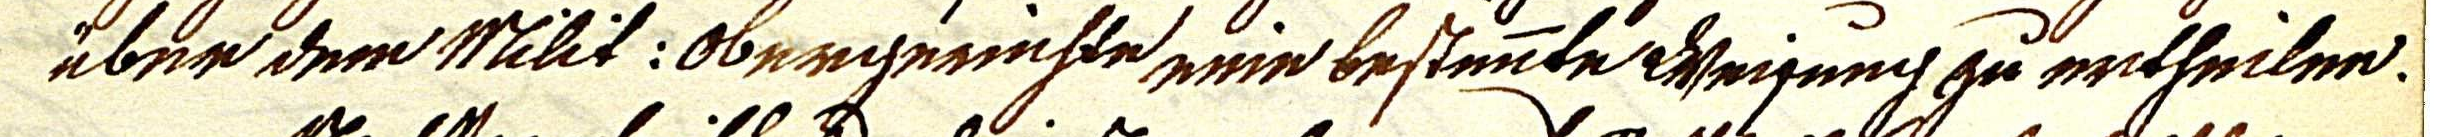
über dem Milit: Obergerichte eine bestimmte Weisung zu ertheilen.
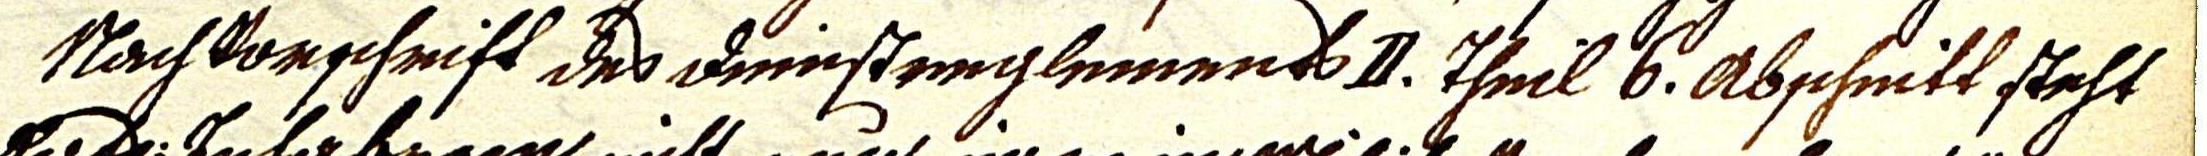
Nach Vorschrift des Dienstreglements II. Theil 6. Abschnitt steht
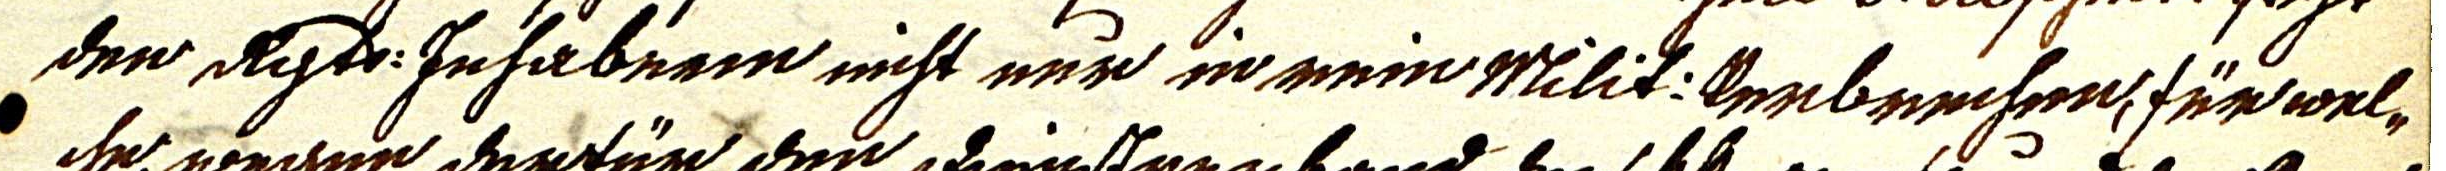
den Rgts: Jnhabern nicht nur in rein Milit: Verbrechen, für wel¬
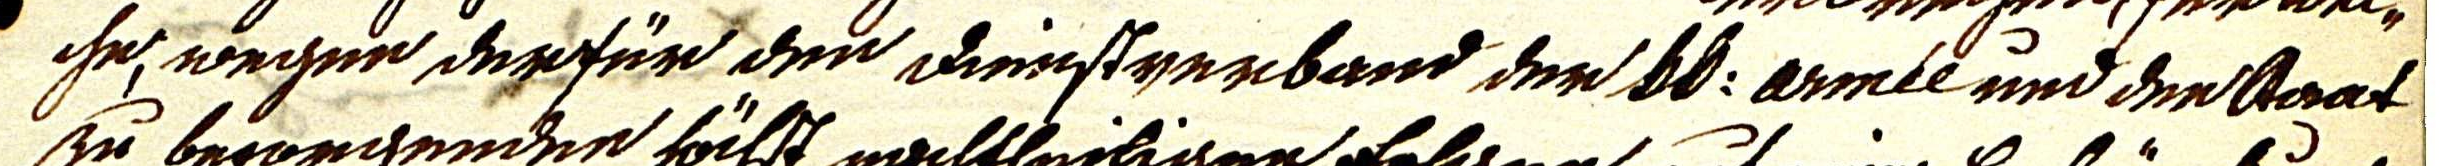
che, wegen der für den Dienstverband der kk: armte und den Staat
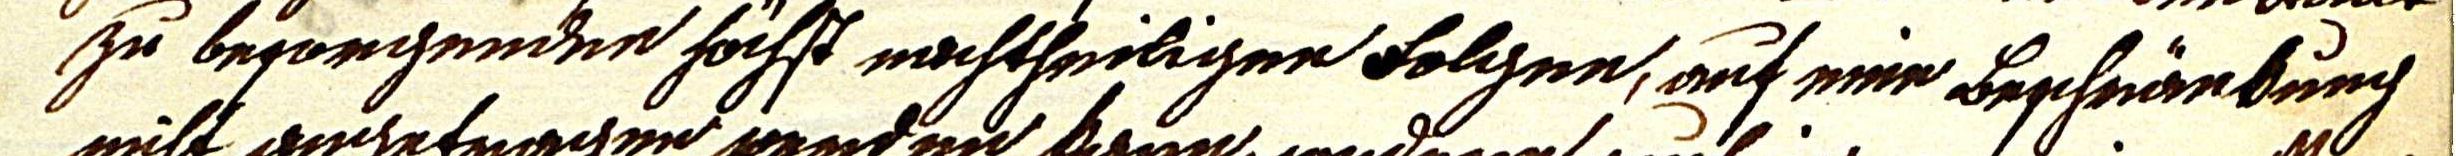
zu besorgenden höchst nachtheiligen Solgen, auf eine Beschränkung
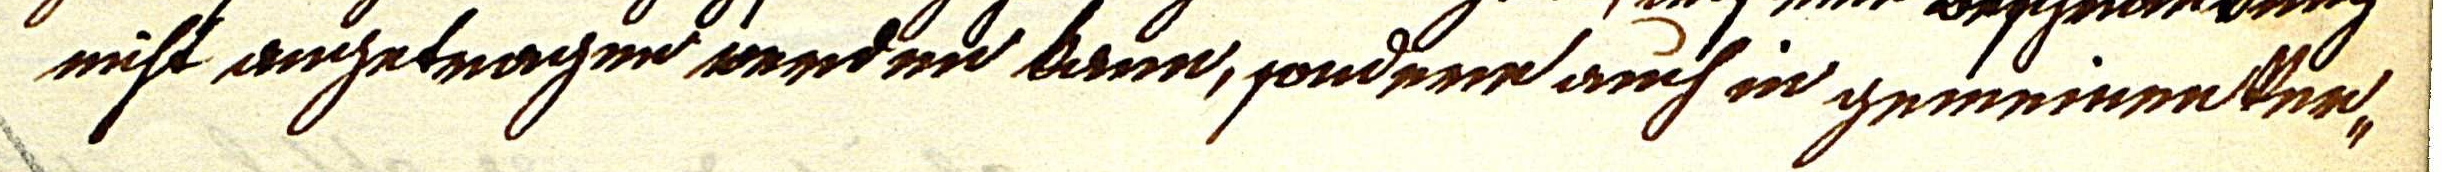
nicht angetragen werden kann, sondere auch in gemeinen Ver¬
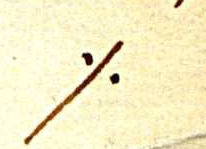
./.
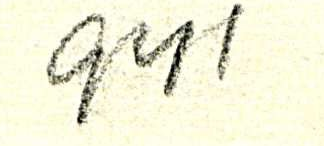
941
